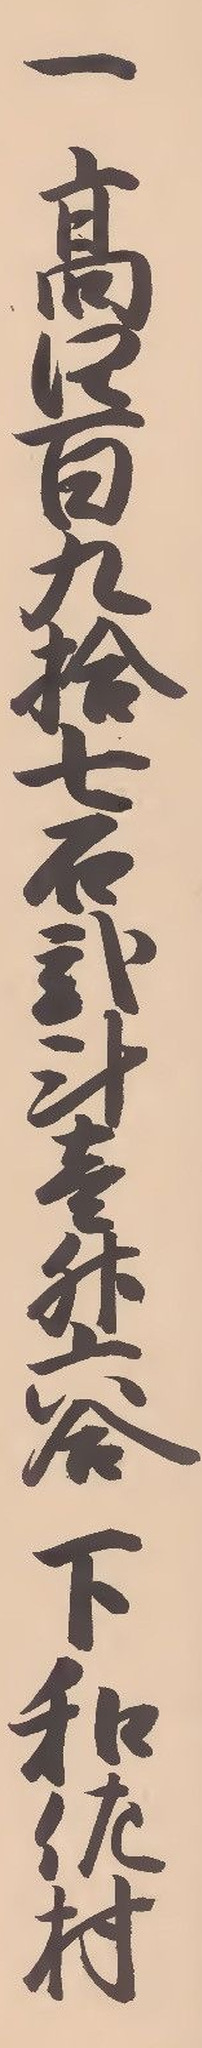一高四百九拾七石弐斗壱升六合下和佐村
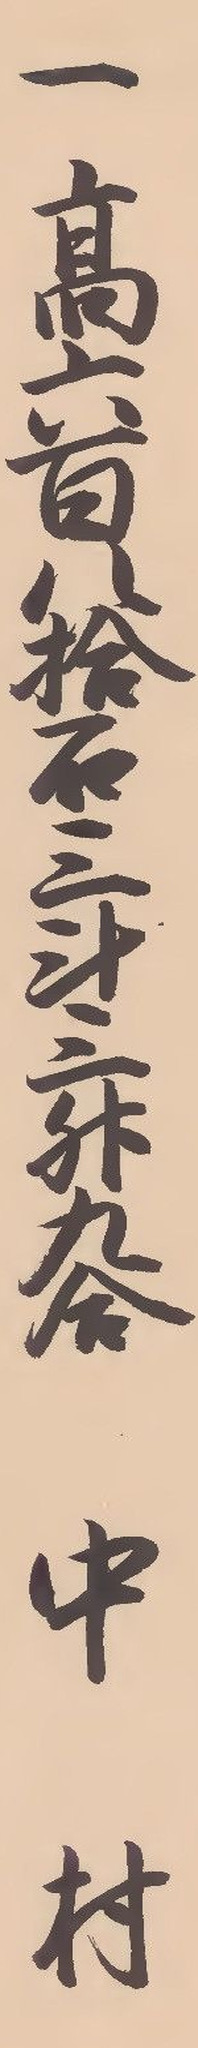一高六百八拾石三斗三升九合中村
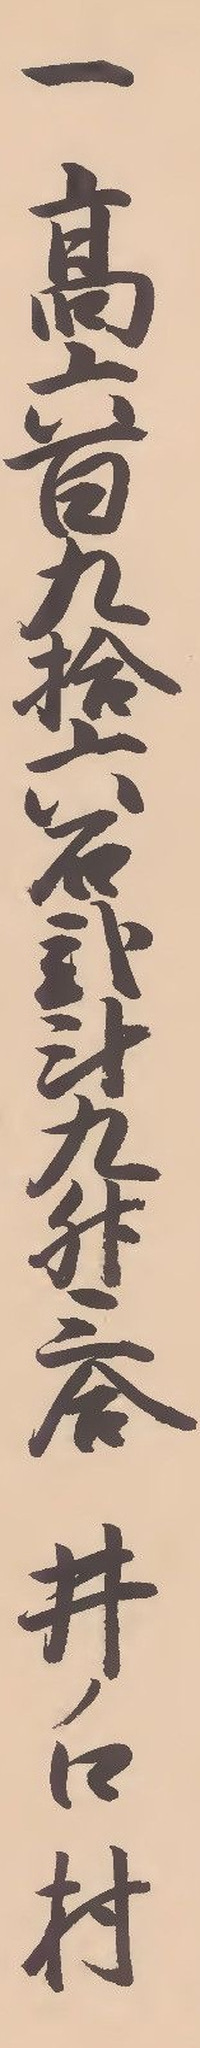一高六百九拾六石弐斗九升三合井ノ口村
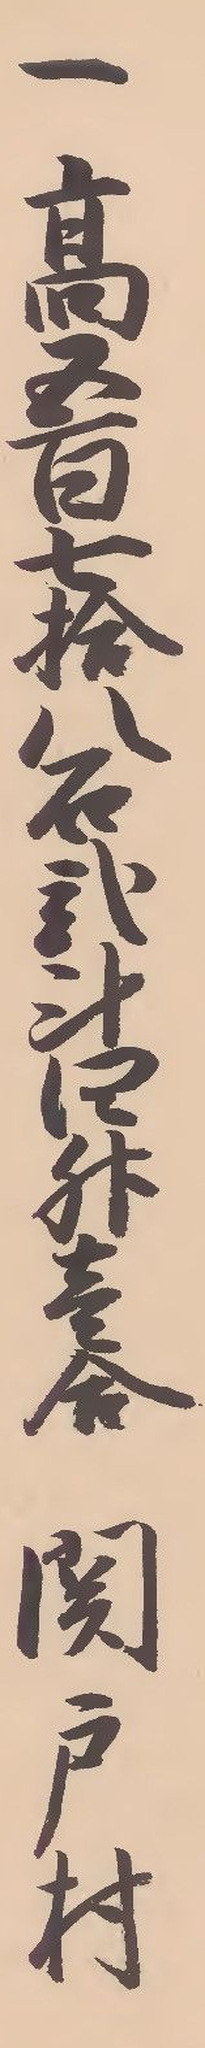一高五百七拾八石弐斗四升壱合関戸村

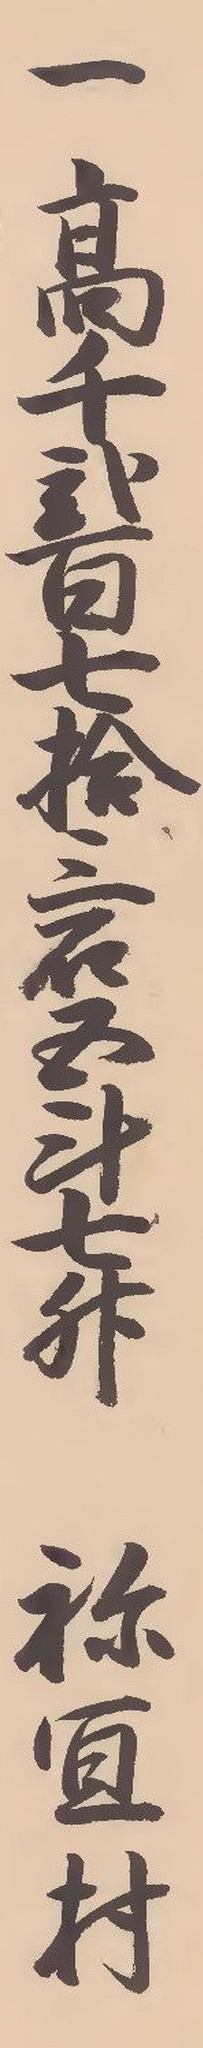一高千弐百七拾三石五斗七升祢宜村
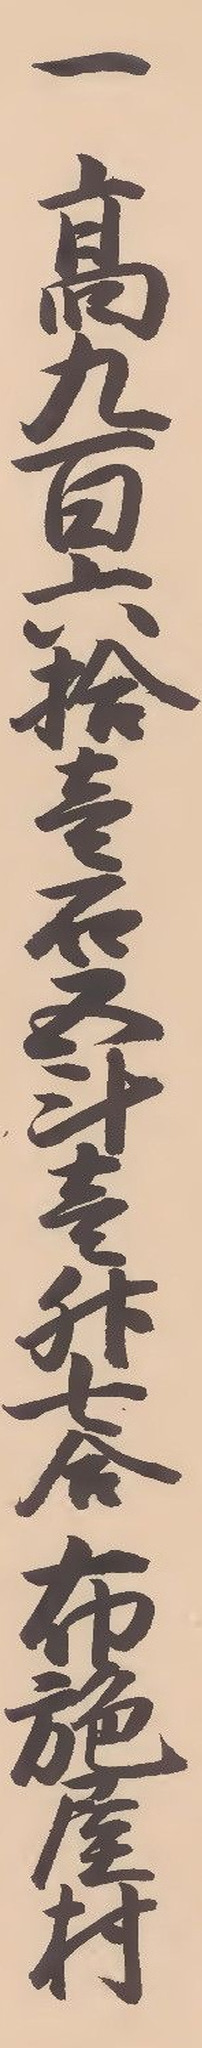一高九百六拾壱石五斗壱升七合布施屋村
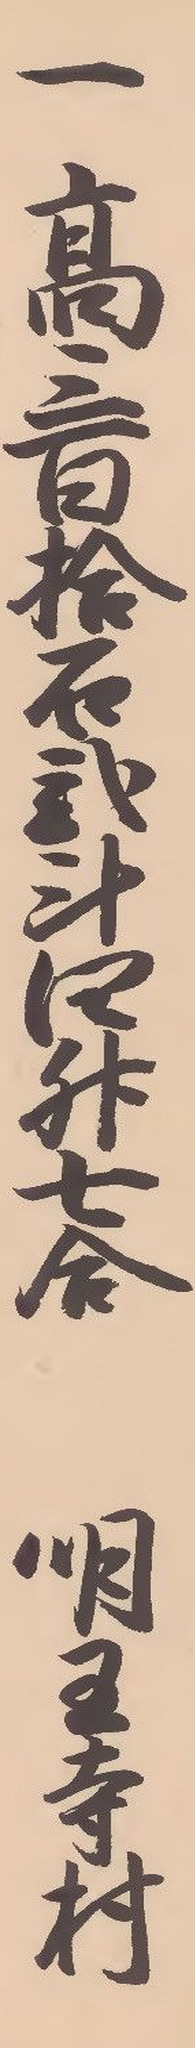一高三百拾石弐斗四升七合明王寺村
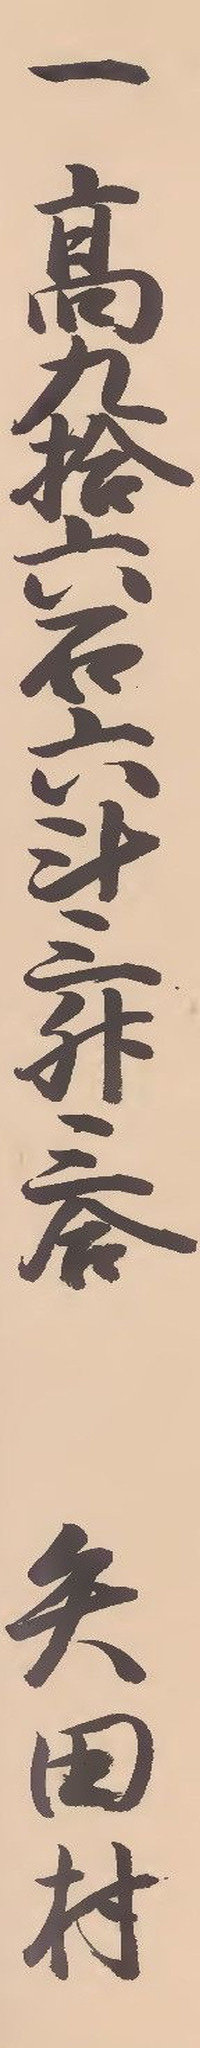一高九拾六石六斗三升三合矢田村
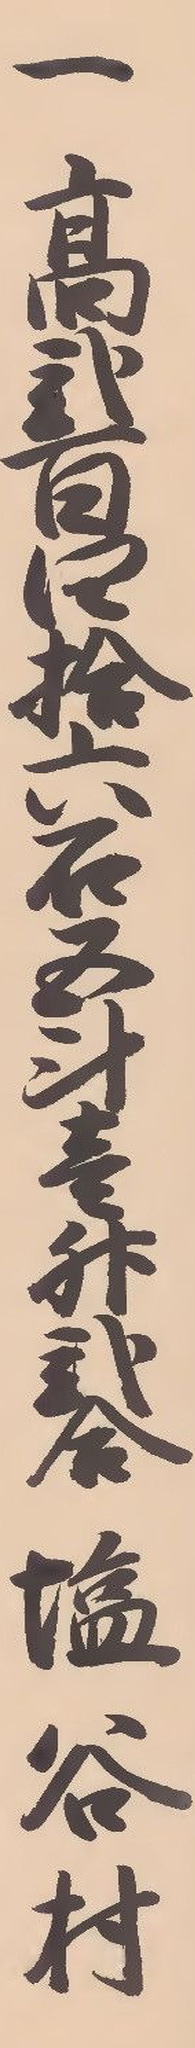一高弐百四拾六石五斗壱升弐合塩谷村
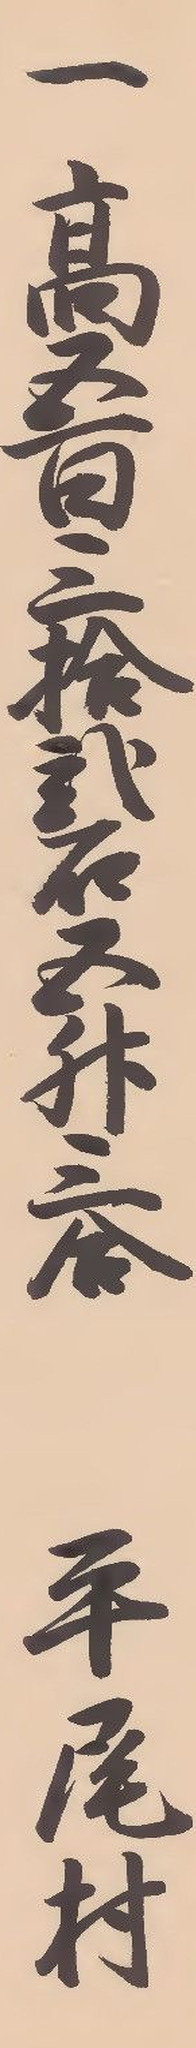一高五百三拾弐石五升三合平尾村
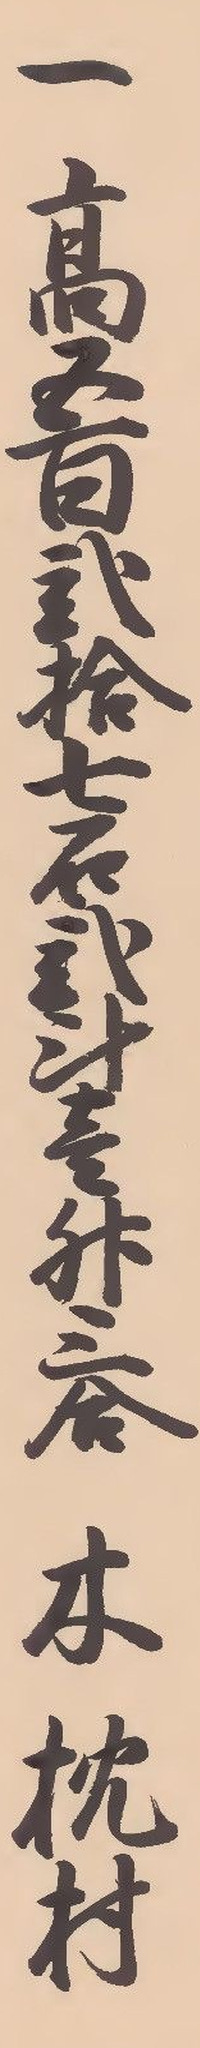一高五百弐拾七石弐斗壱升三合木枕村
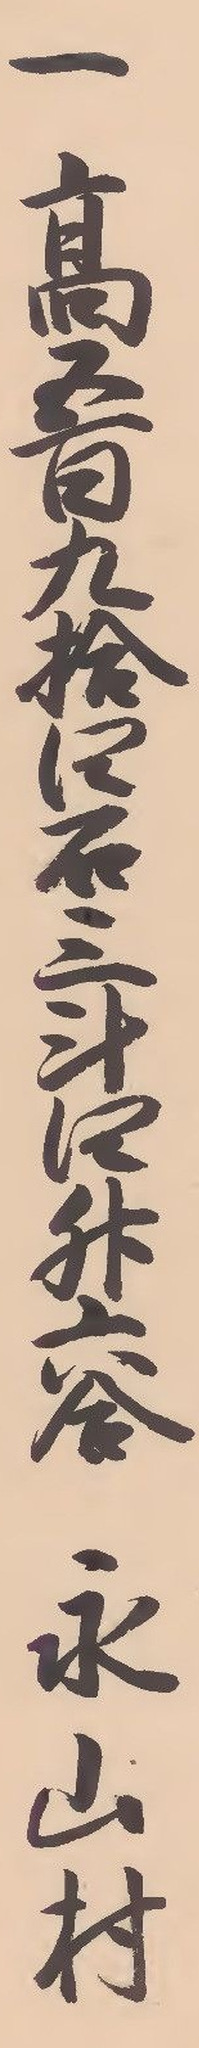一高五百九拾四石三斗四升六合永山村

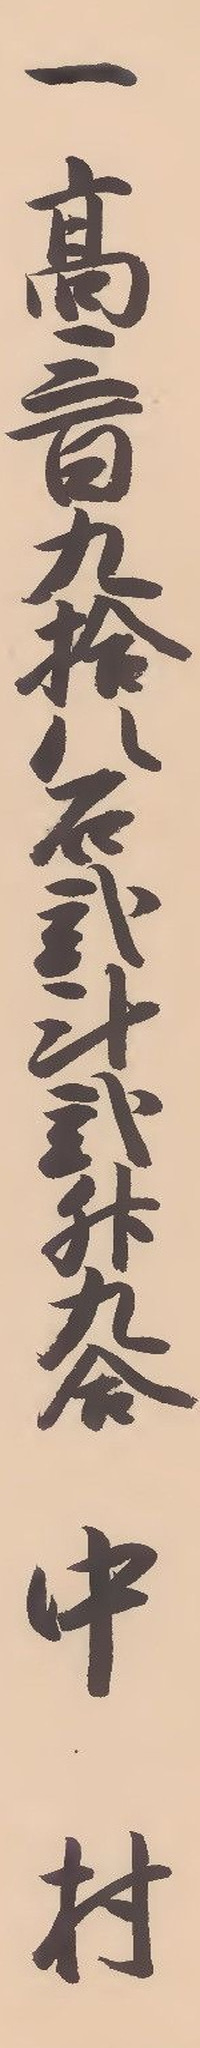一高三百九拾八石弐斗弐升九合中村
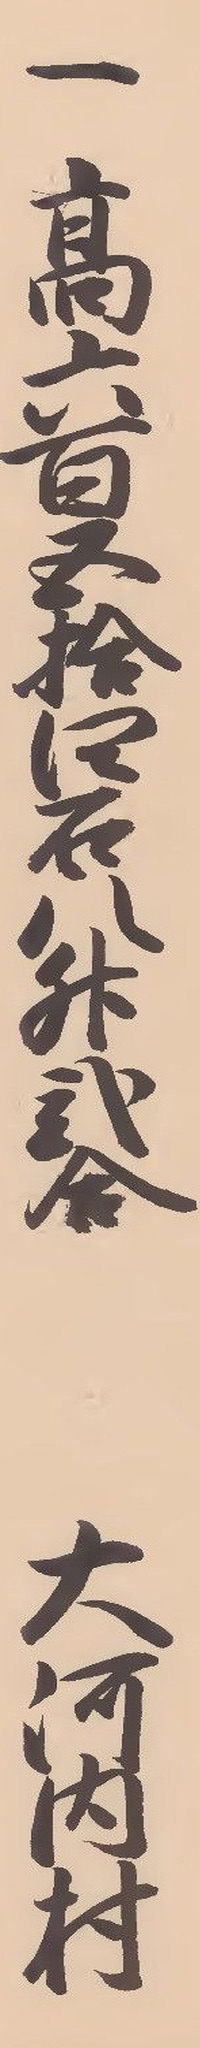一高六百五拾四石八升弐合大河内村
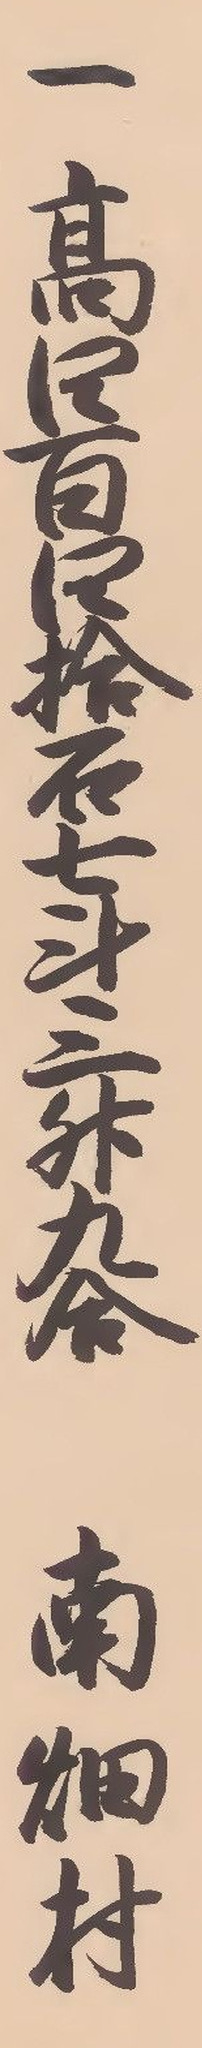一高四百四拾石七斗三升九合南畑村
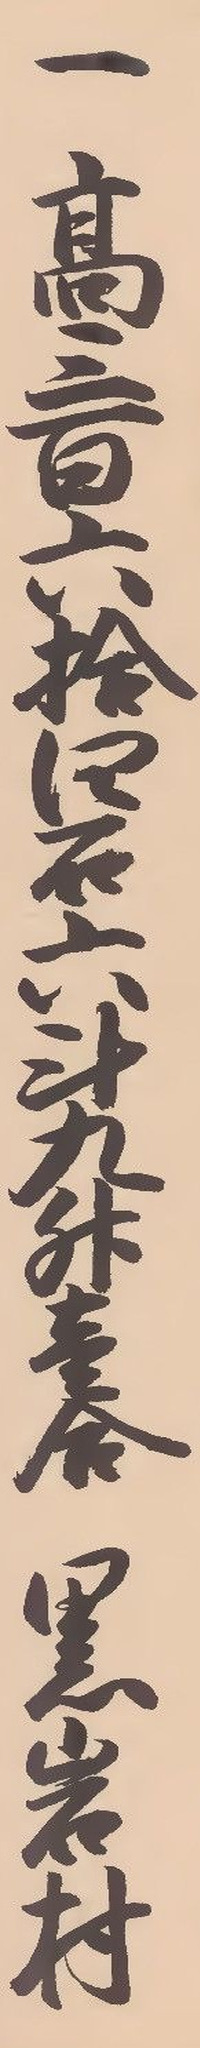一高三百六拾四石六斗九升壱合黒岩村
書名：紀伊国郷帳
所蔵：国立公文書館 National Archives of Japan
